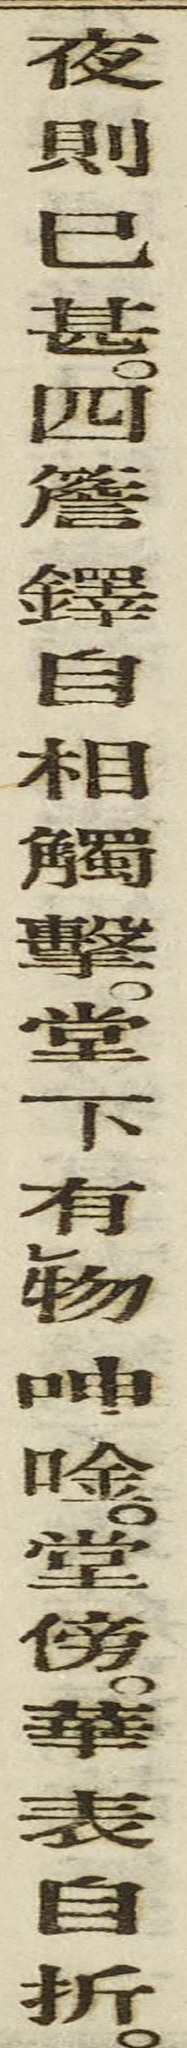夜則巳甚。四簷鐸自相触撃。堂下有物唫呻。堂傍。華表自折。
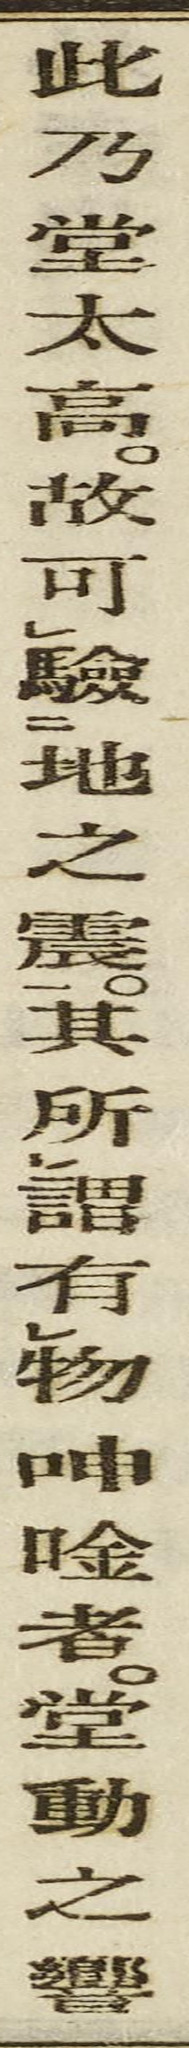此乃堂太高。故可験ニ地之震。其所謂有物唫呻者。堂動之響
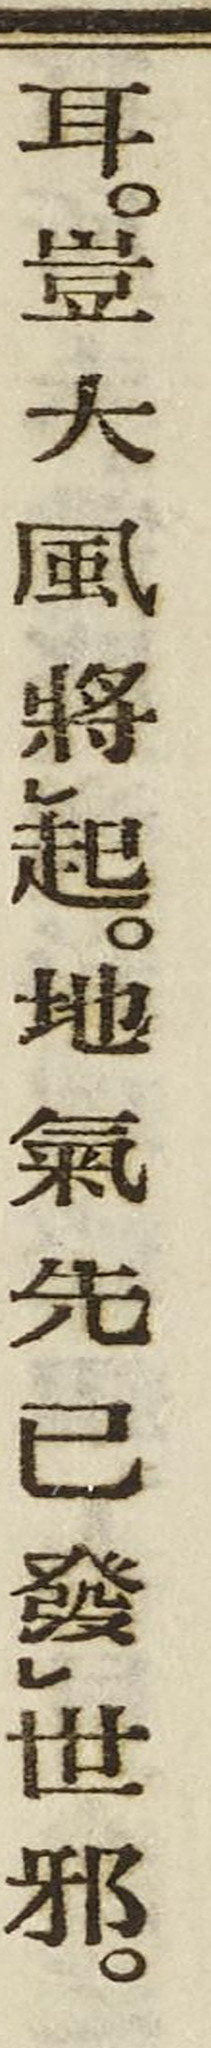耳。豈大風将起。地気先已発世邪。
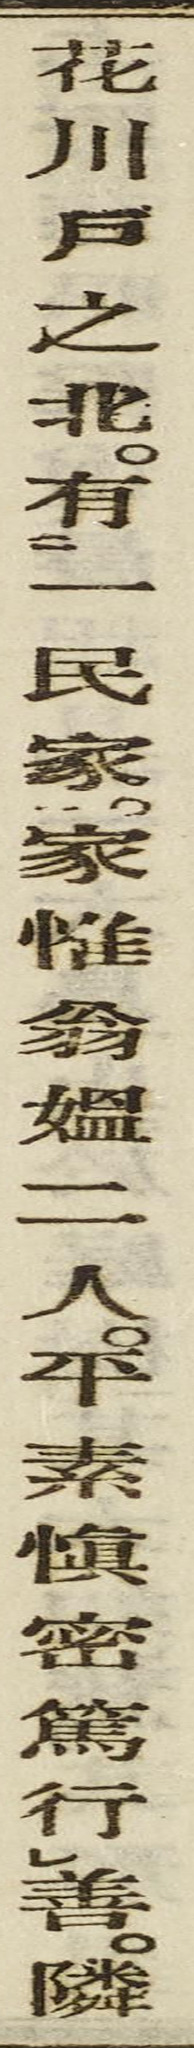花川戸之北。有ニ一民家。家惟翁媼二人。平素慎密篤行善。隣
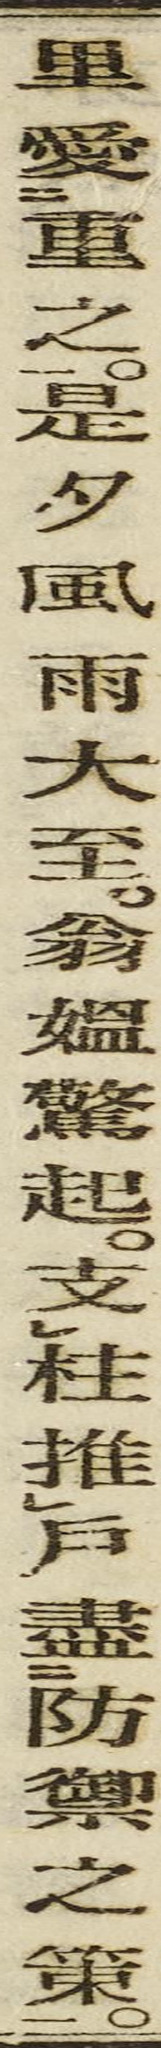里愛ニ重之。是夕風雨大至。翁媼驚起。支柱推戸尽ニ防禦之策。
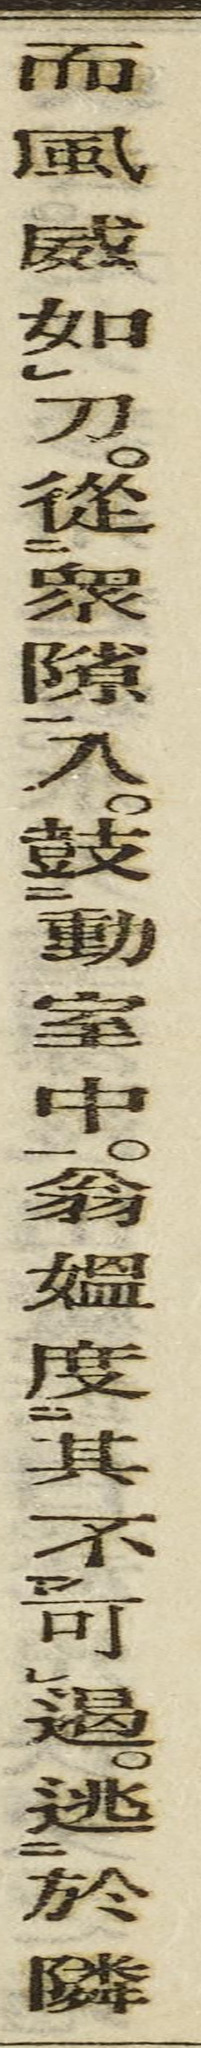而風威如刀。従ニ衆隙入。鼓ニ動室中。翁媼度ニ其不レ可遏。逃ニ於隣
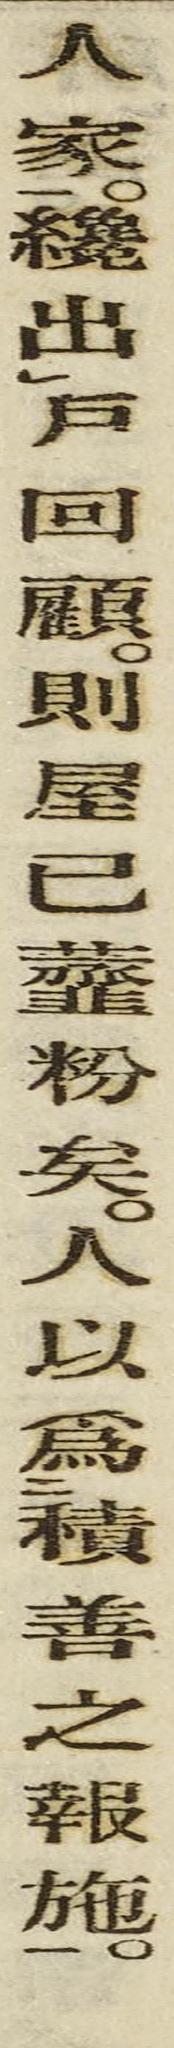人家。纔出戸回顧。則屋已虀粉矣。人以為ニ積善之報施。
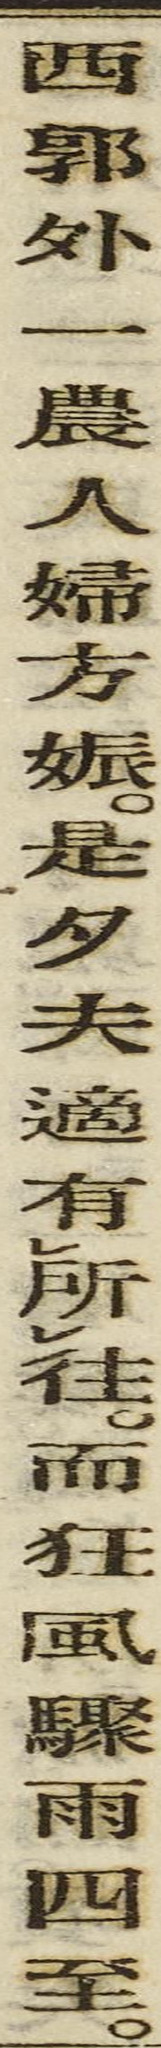西郭外一農人婦方娠。是夕夫適有所往。而狂風驟雨四至。
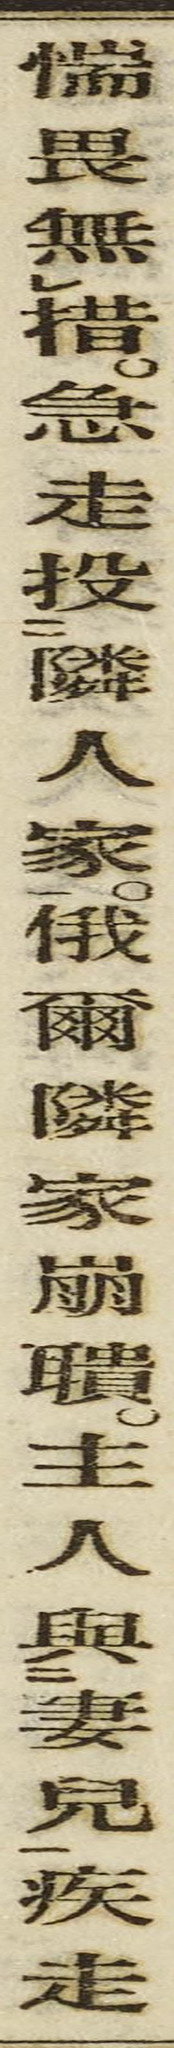惴畏無措。急走投ニ隣人家。俄爾隣家崩聵。主人与ニ妻児疾走
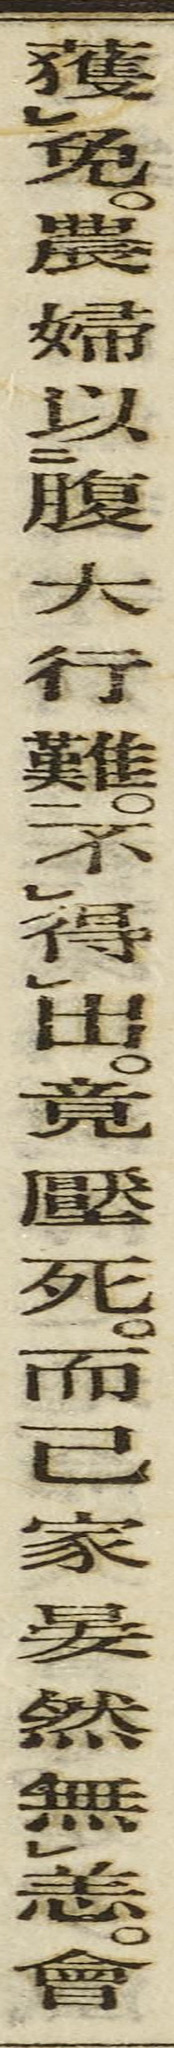獲免。農婦以ニ腹大行難。不得出。竟圧死。而己家晏然無恙。会
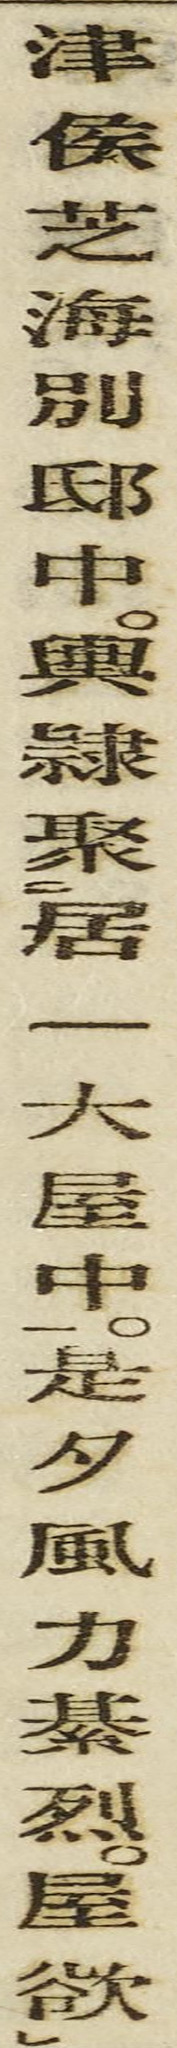津侯芝海別邸中。輿隷聚ニ居一大屋中。是夕風力綦烈。屋欲
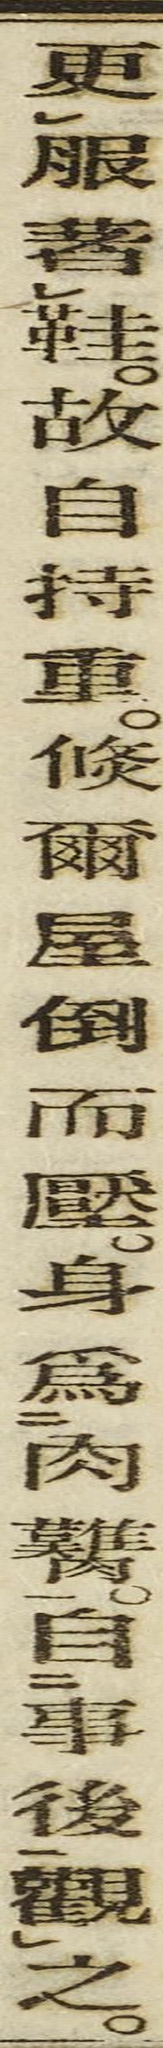更服著鞋。故自持重。倐爾屋倒而圧。身為ニ肉臡。自ニ事後観之。
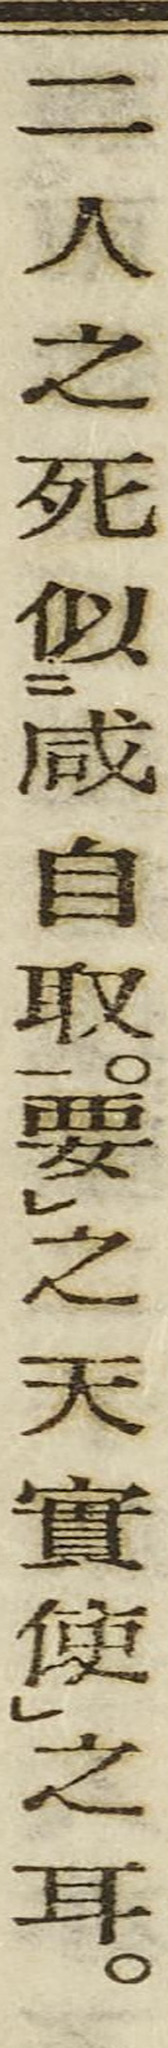二人之死似ニ咸自取。要之天実使之耳。
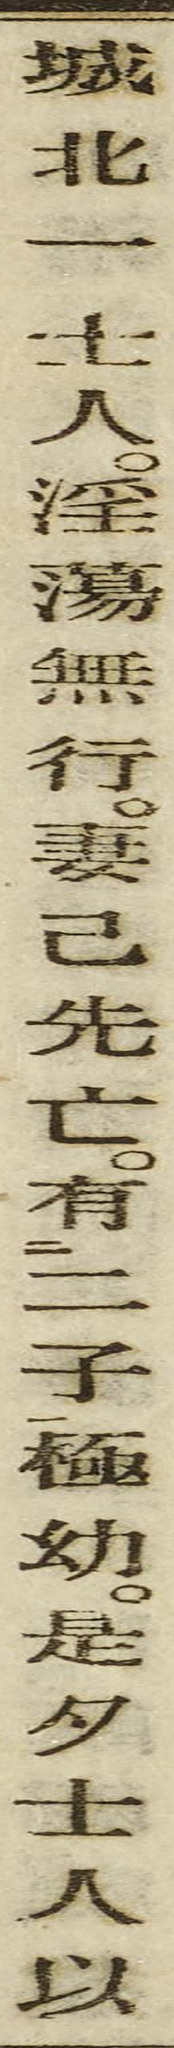城北一士人。淫蕩無行。妻已先亡。有ニ二子極幼。是夕士人以

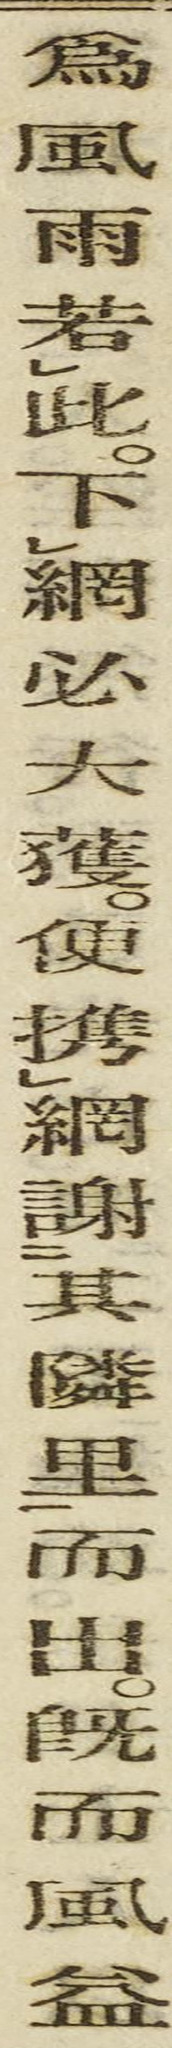為風雨若此。下網必大獲。便携網謝ニ其隣里而出。既而風益
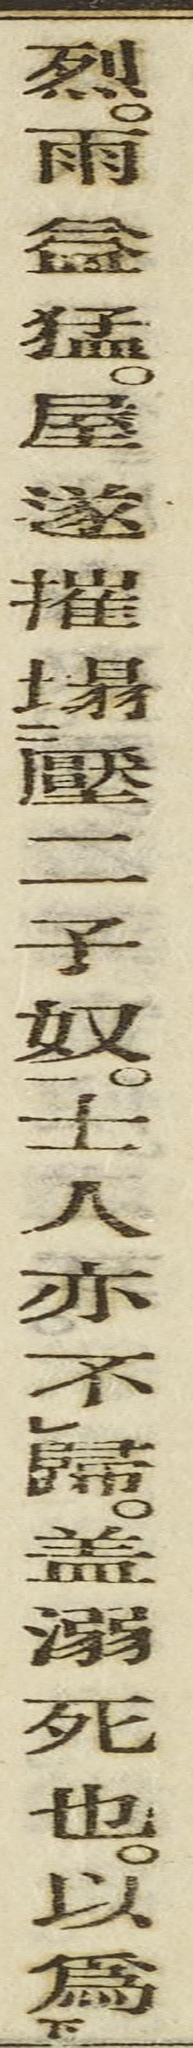烈。雨益猛。屋遂摧搨ニ圧ニ子奴。士人亦不帰。盖溺死也。以為
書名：史籍集覽　朝鮮陣古文・細井廣澤記・颶風紀事・天明七年將軍宣下次第書　全
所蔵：東京大学地震研究所図書室 Earthquake Research Institute Library, The University of Tokyo, JAPAN
